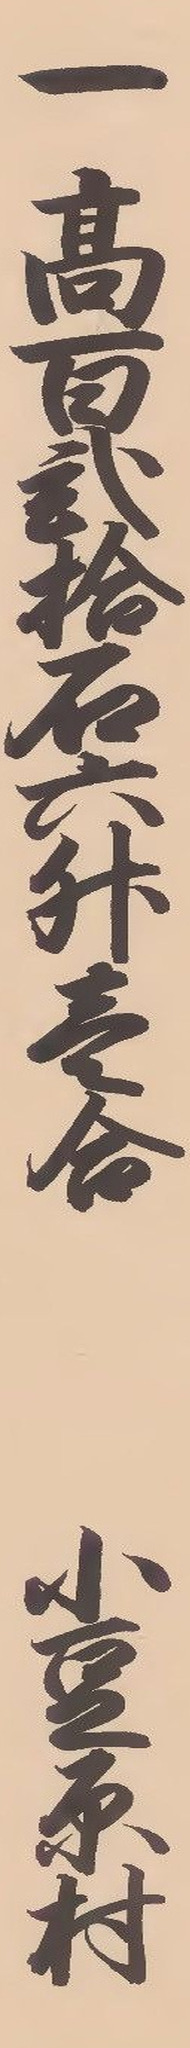一高百弐拾石六升壱合小豆原村
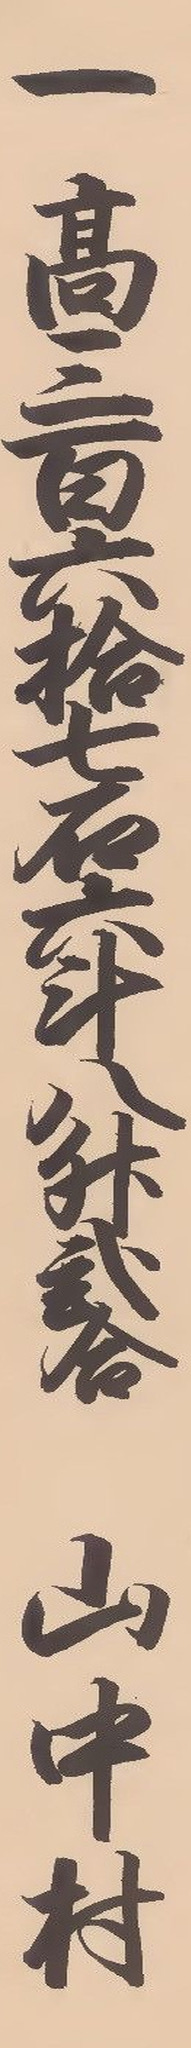一高三百六拾七石六斗八升弐合山中村

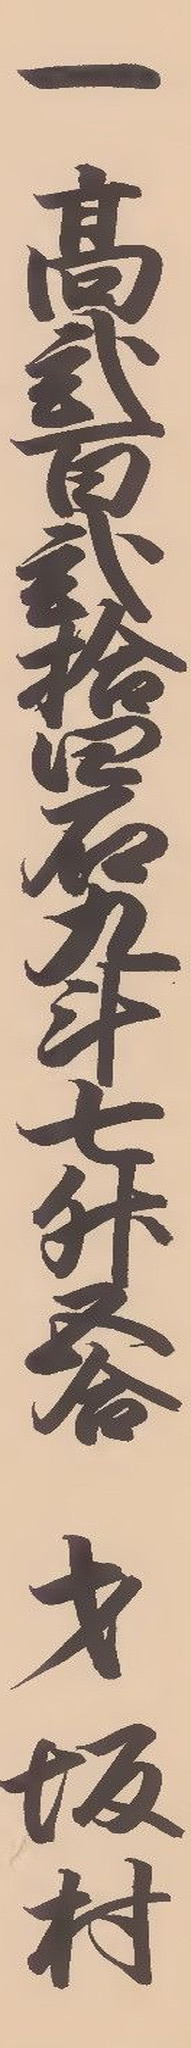一高弐百弐拾四石九斗七升五合才坂村
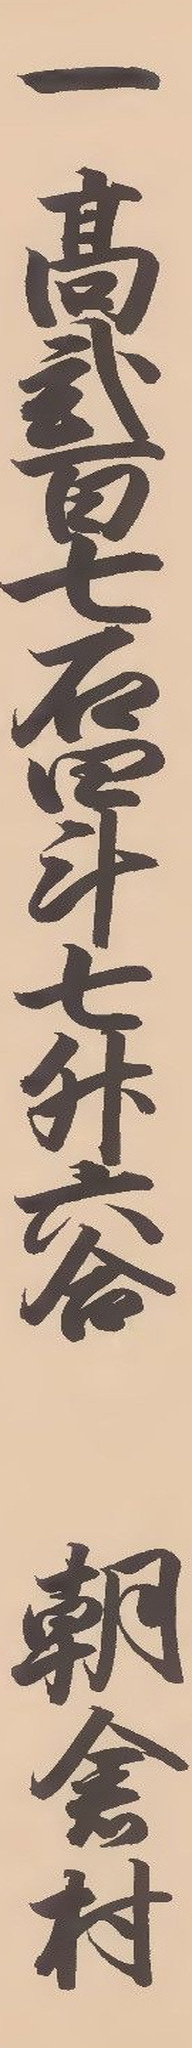一高弐百七石四斗七升六合朝倉村
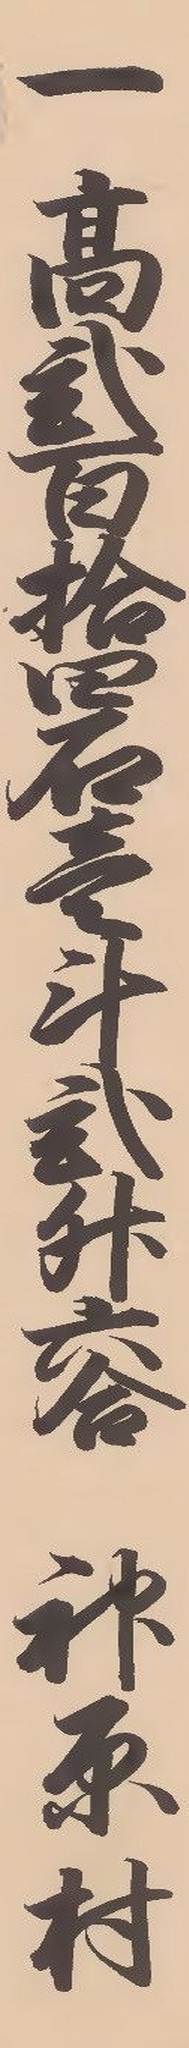一高弐百拾四石壱斗弐升六合神原村
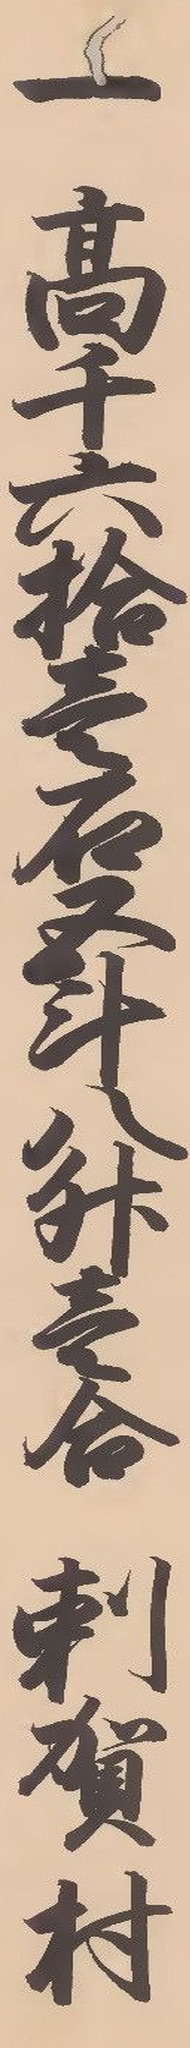一高千六拾壱石五斗八升壱合刺賀村
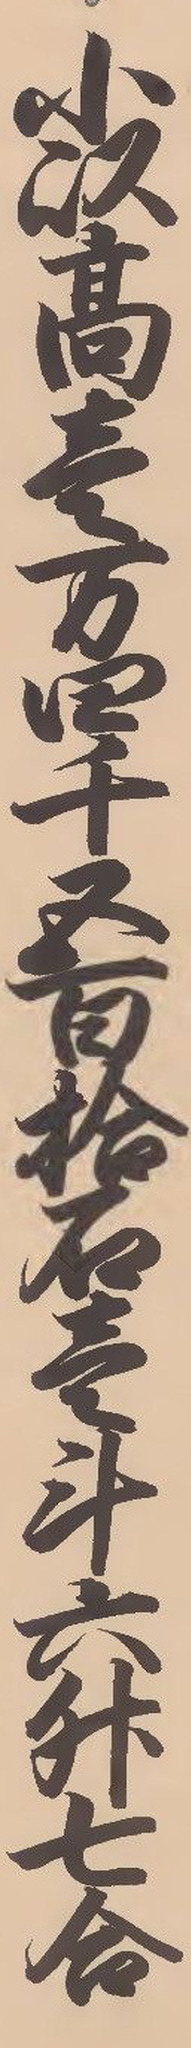小以高壱万四千五百拾石壱斗六升七合

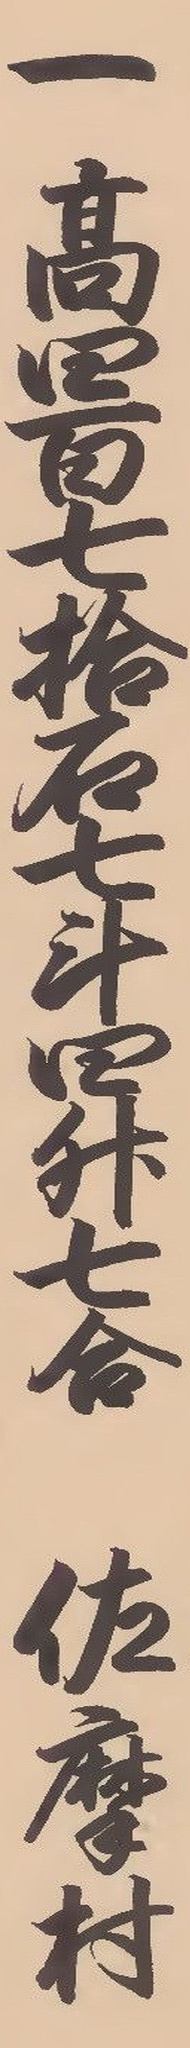一高四百七拾石七斗四升七合佐摩村
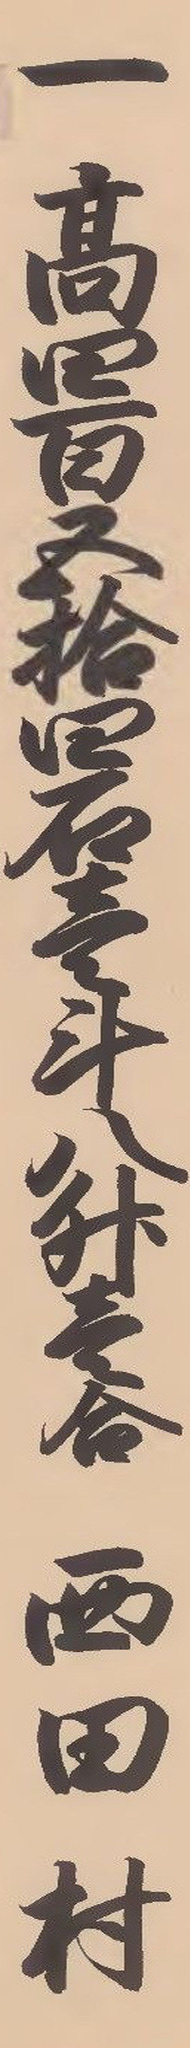一高四百五拾四石壱斗八升壱合西田村
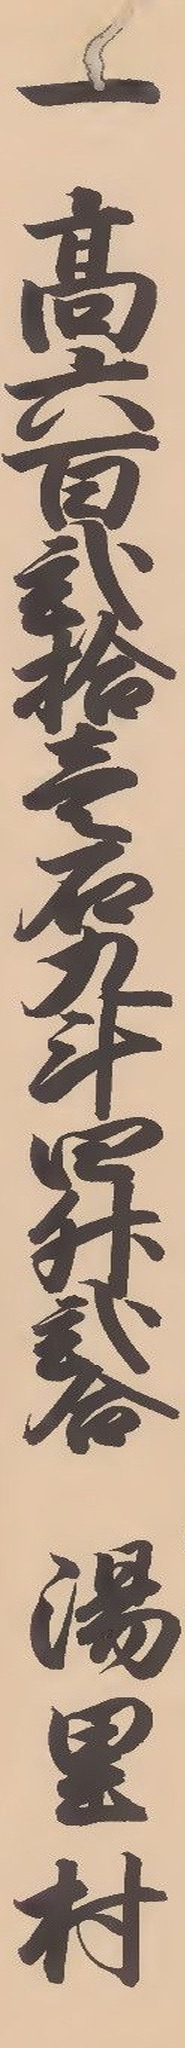一高六百弐拾壱石九斗四升弐合湯里村
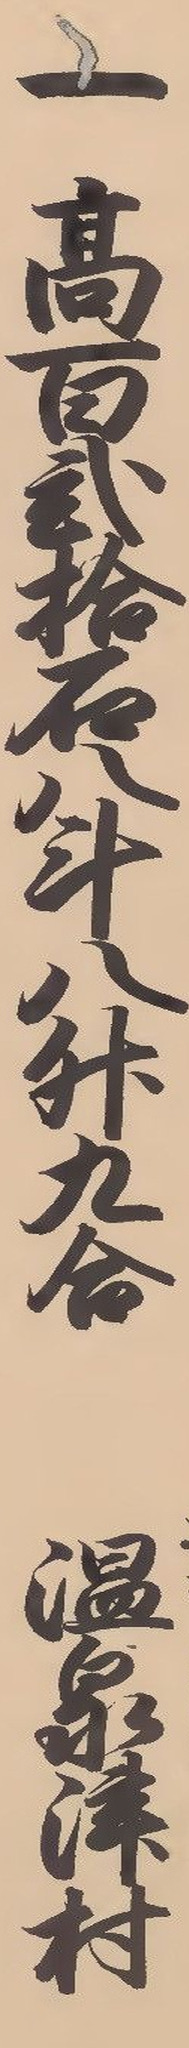一高百弐拾石八斗八升九合温泉津村
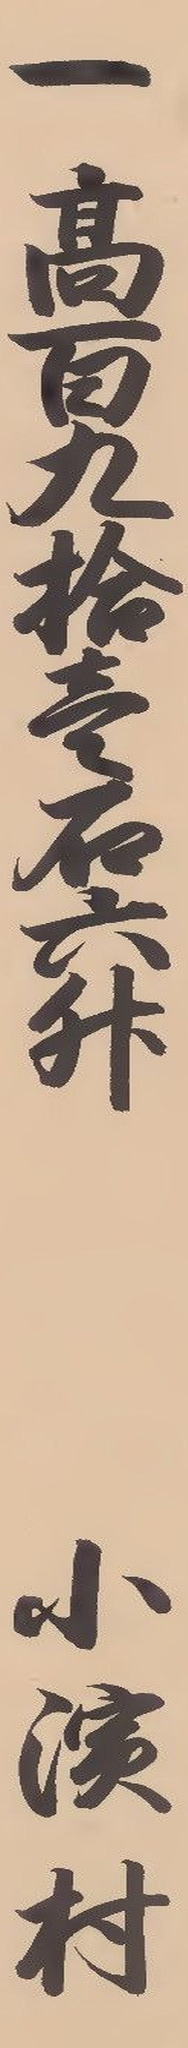一高百九拾壱石六升小浜村
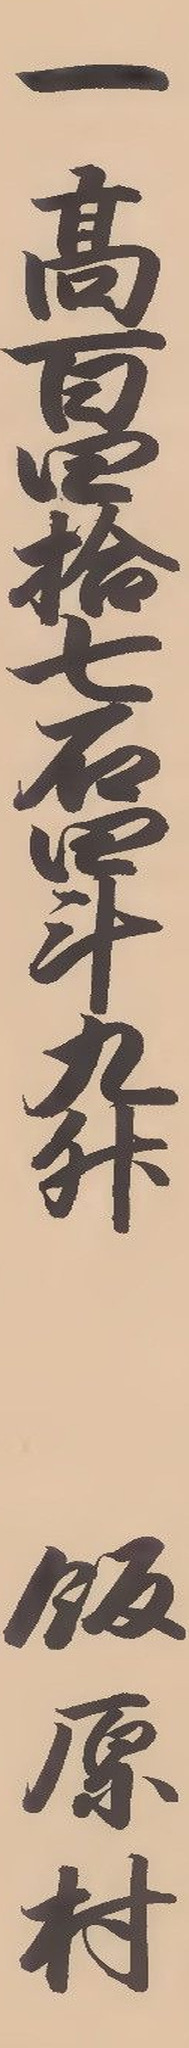一高百四拾七石四斗九升飯原村
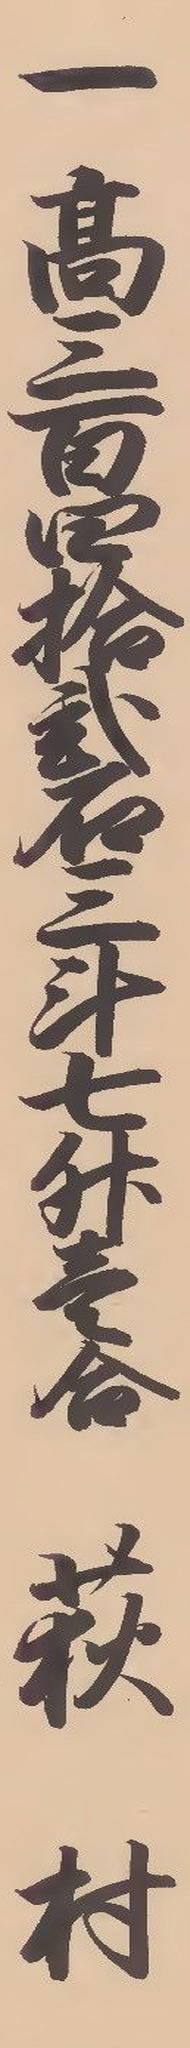一高三百四拾弐石三斗七升壱合荻村

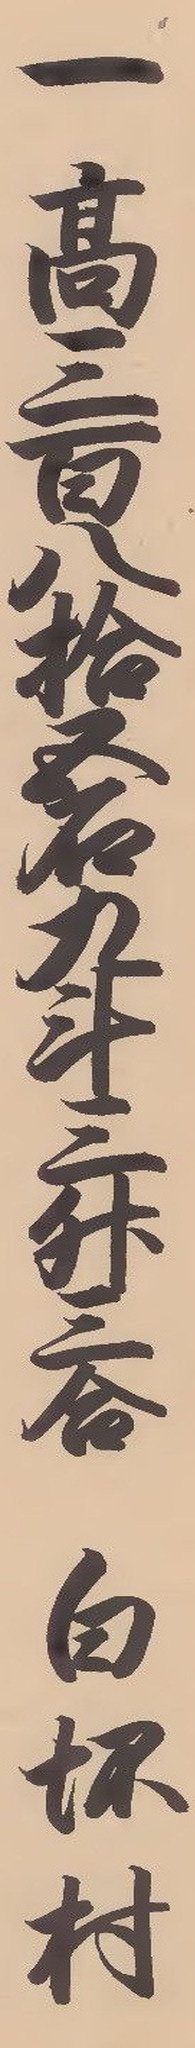一高三百八拾五石九斗三升三合白坏村
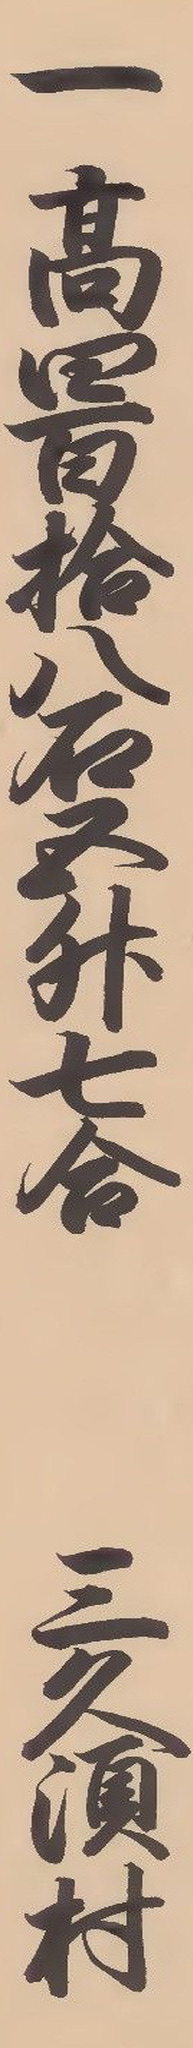一高四百拾八石五升七合三久須村
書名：石見国郷帳
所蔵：国立公文書館 National Archives of Japan
